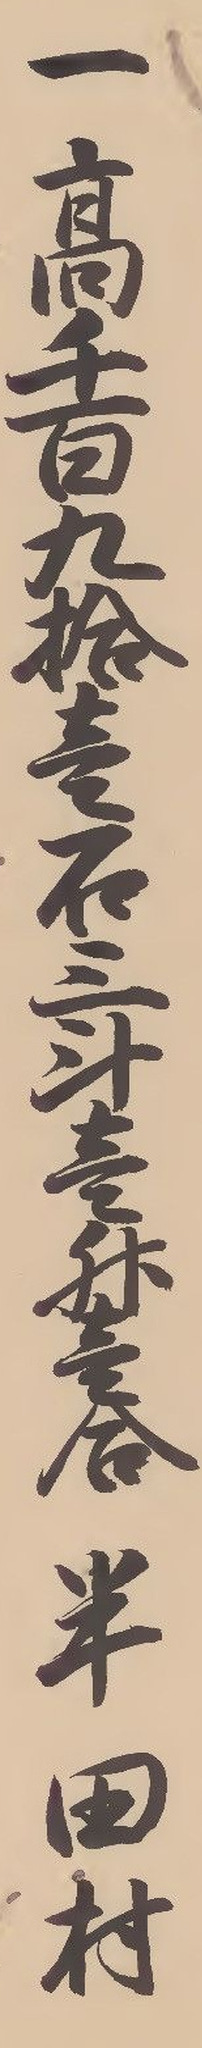一高千百九拾壱石三斗壱升壱合半田村

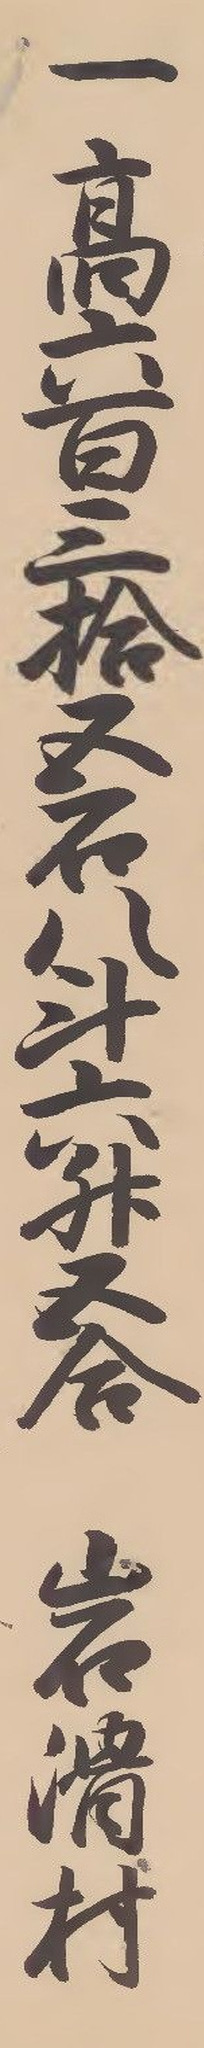一高六百三拾五石八斗六升五合岩滑村
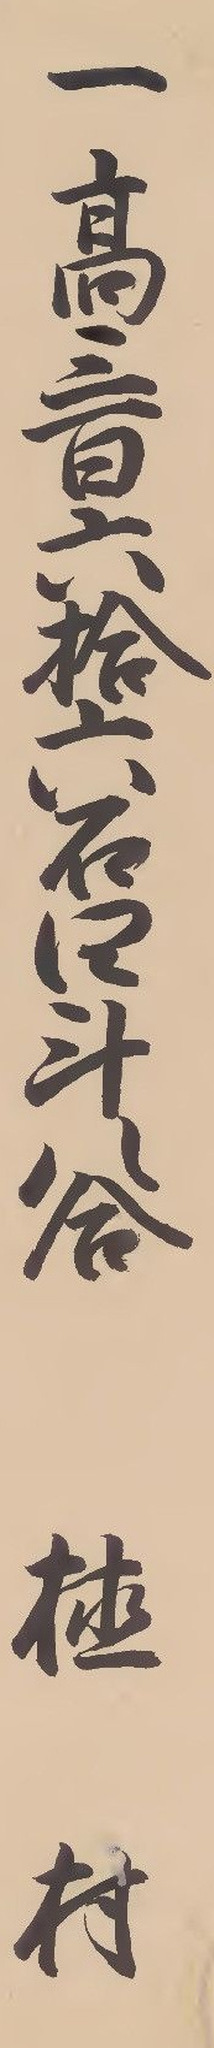一高三百六拾六石四斗八合植村
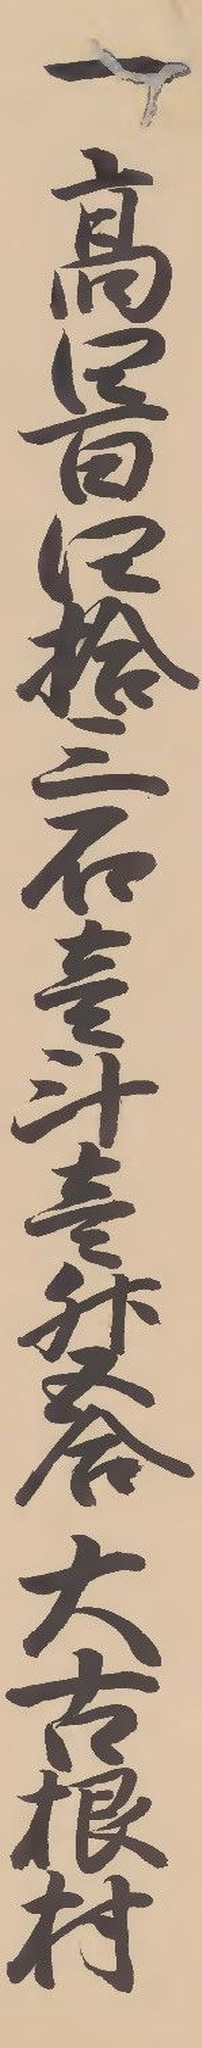一高四百四拾三石壱斗壱升五合大古根村
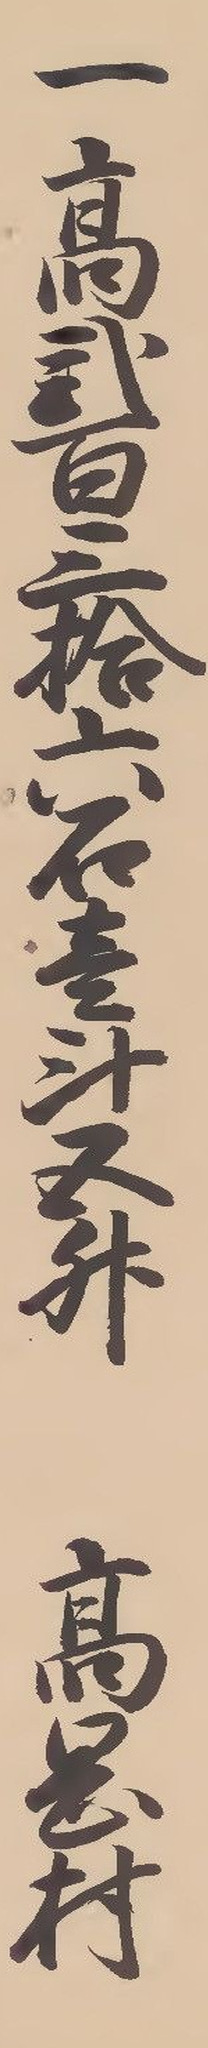一高弐百三拾六石壱斗五升高岡村
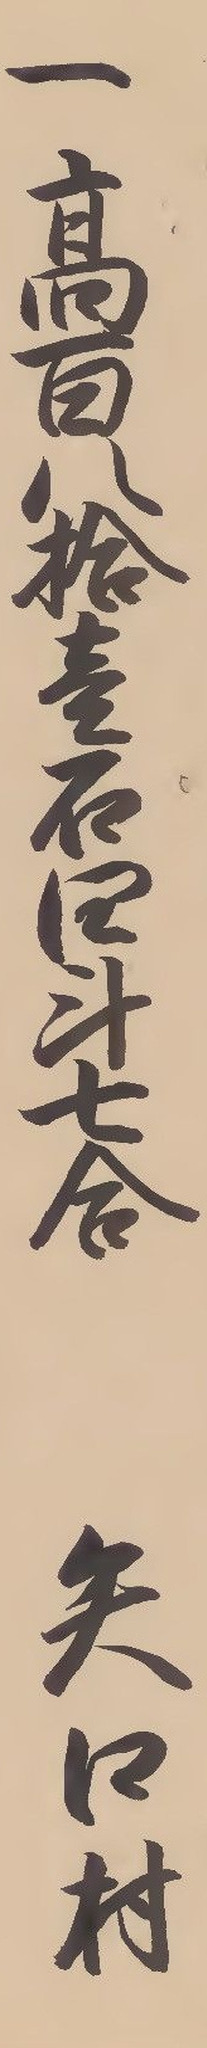一高百八拾壱石四斗七合矢口村
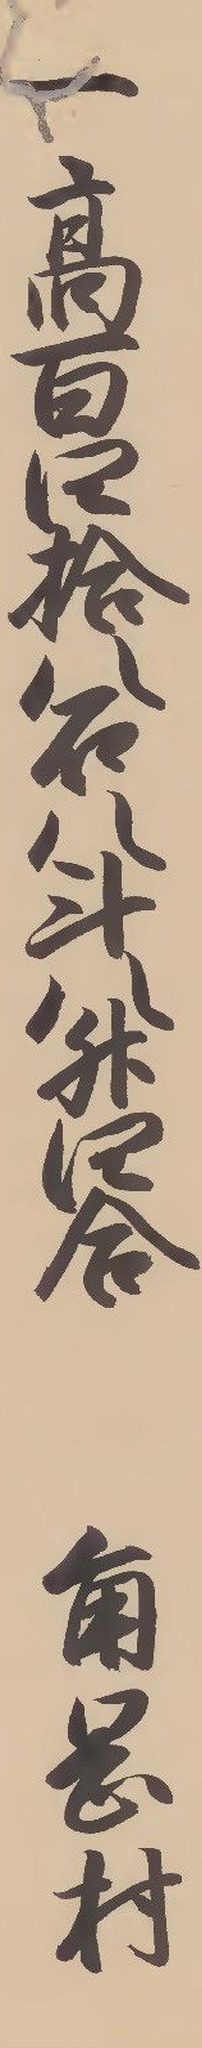一高百四拾八石八斗八升四合角岡村
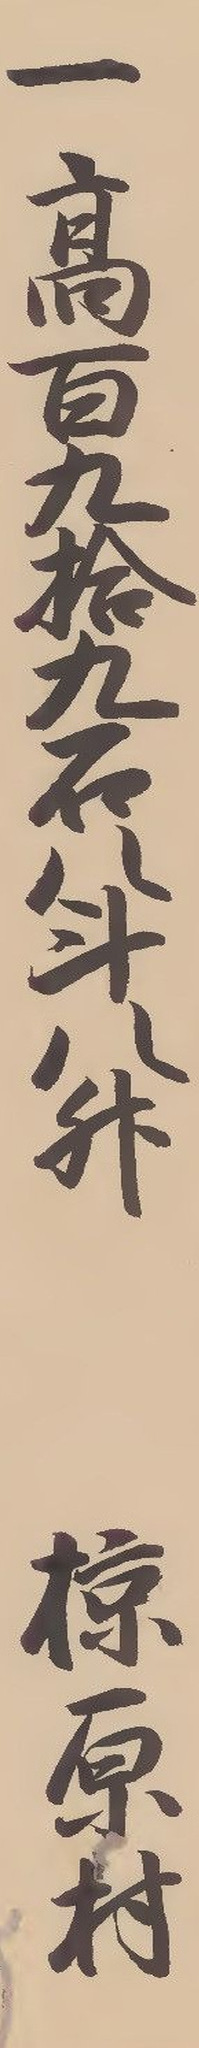一高百九拾九石八斗八升椋原村
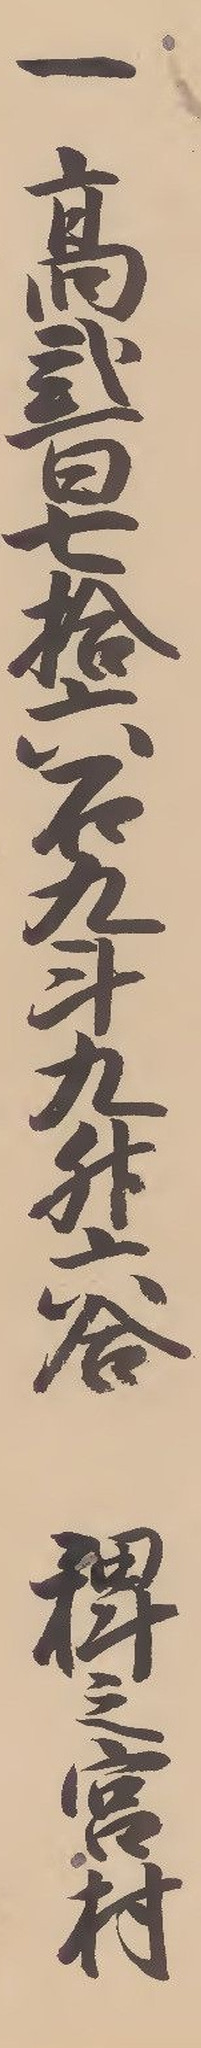一高弐百七拾六石九斗九升六合稗之宮村

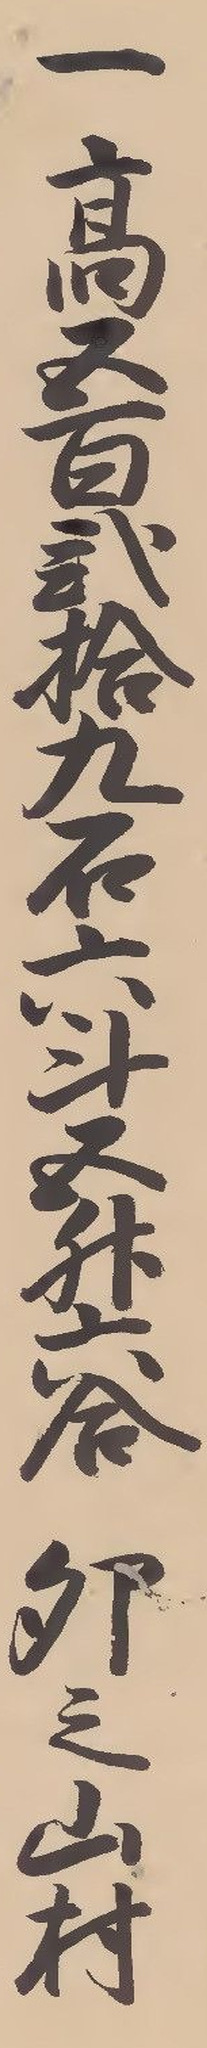一高五百弐拾九石六斗五升六合卯之山村
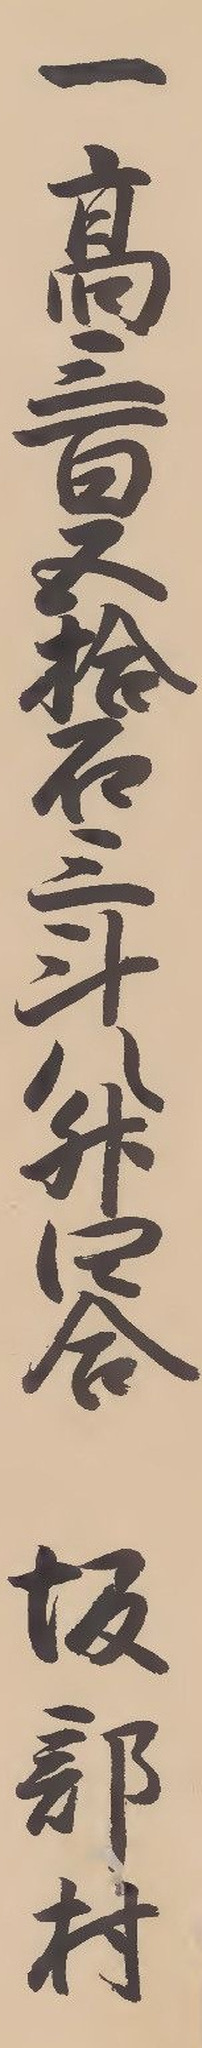一高三百五拾石三斗八升四合坂部村
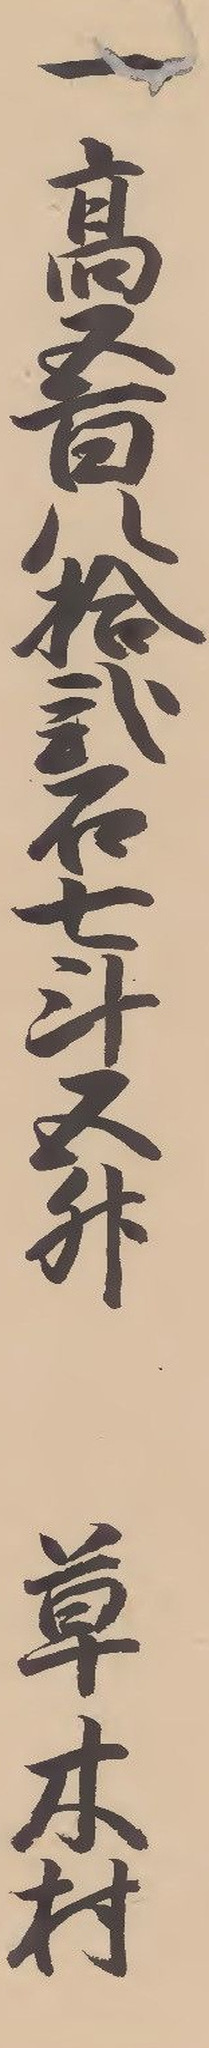一高五百八拾弐石七斗五升草木村
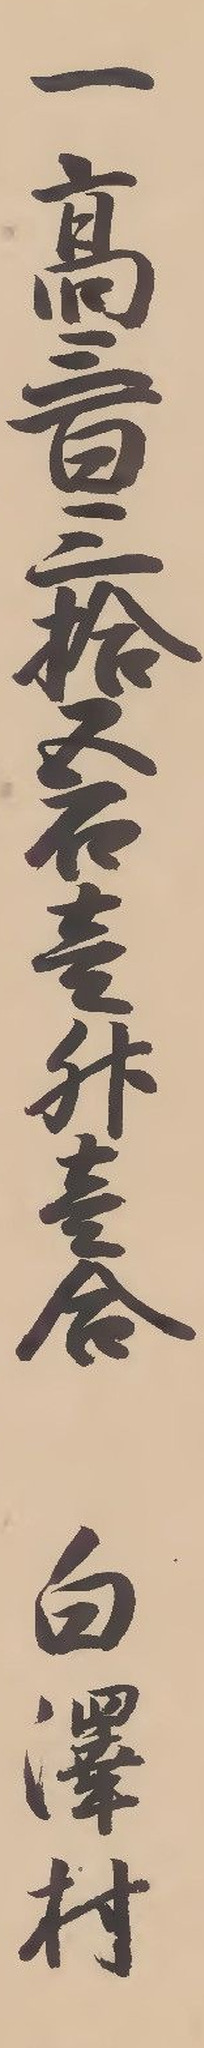一高三百三拾五石壱升壱合白沢村
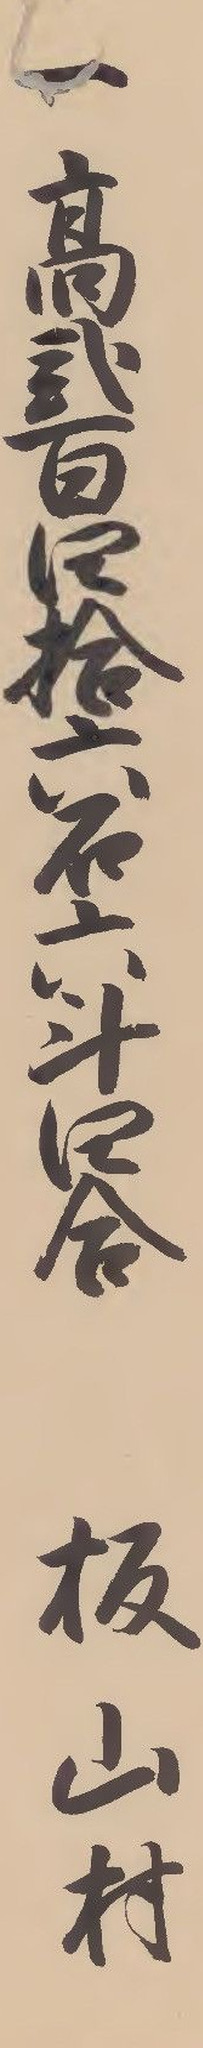一高弐百四拾六石六斗四合板山村
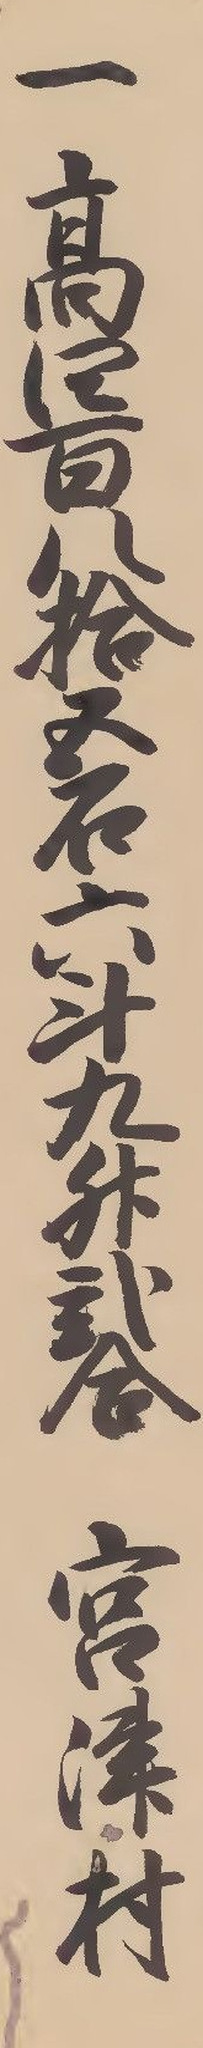一高四百八拾五石六斗九升弐合宮津村

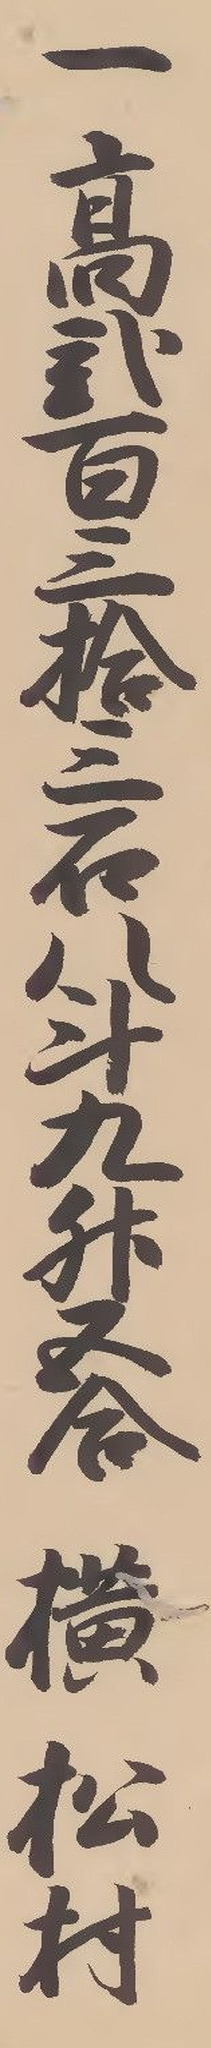一高弐百三拾三石八斗九升五合横松村
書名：尾張国郷帳
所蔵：国立公文書館 National Archives of Japan
